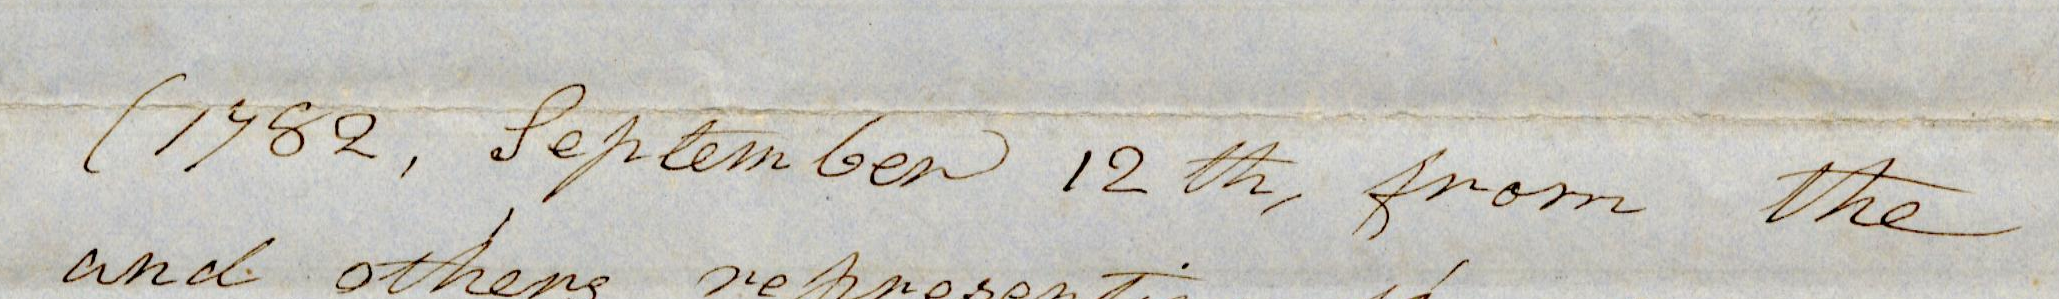(1782, September 12th from the
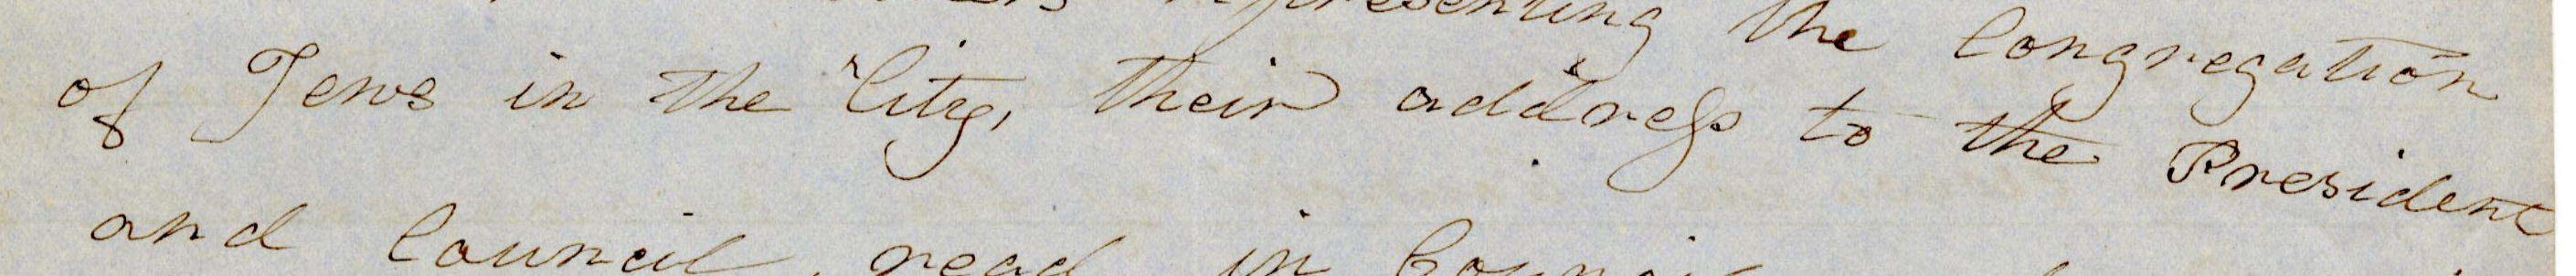of Jews in the City, Their address to the President
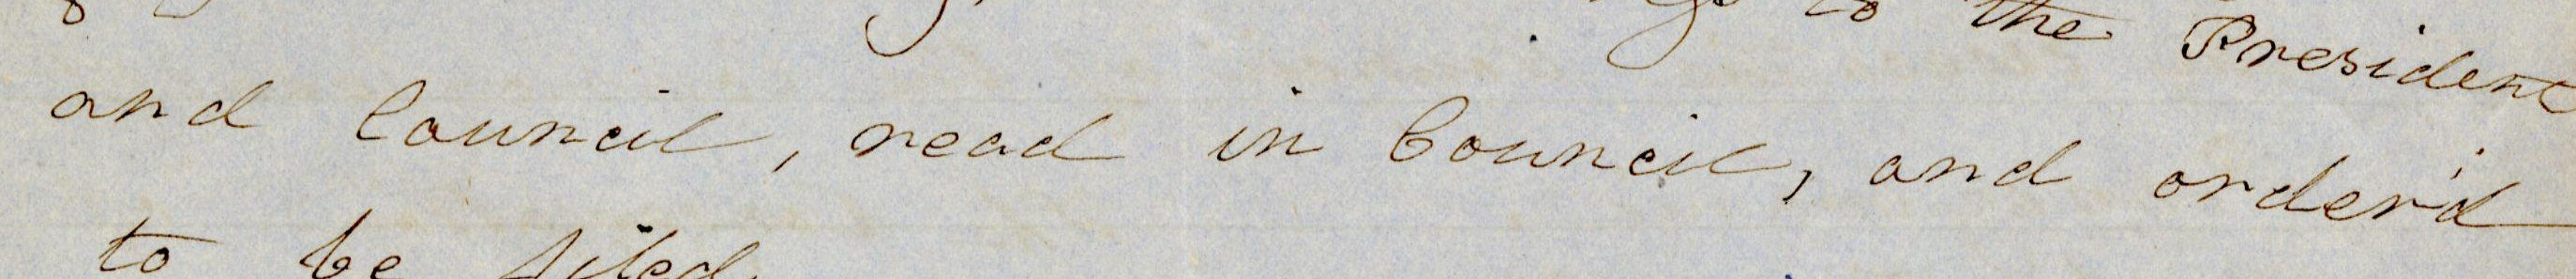and Council, read in Council, and order'd
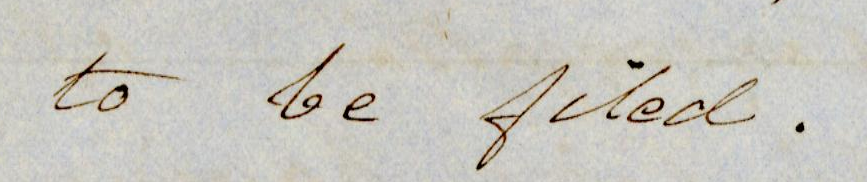to be filed.
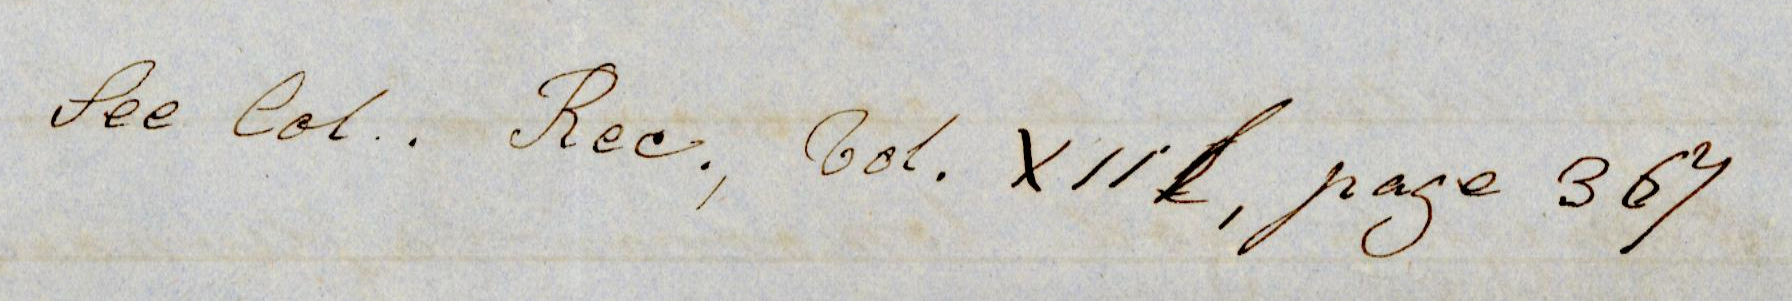Se Col. Rec., Vol. XIIL, page 367
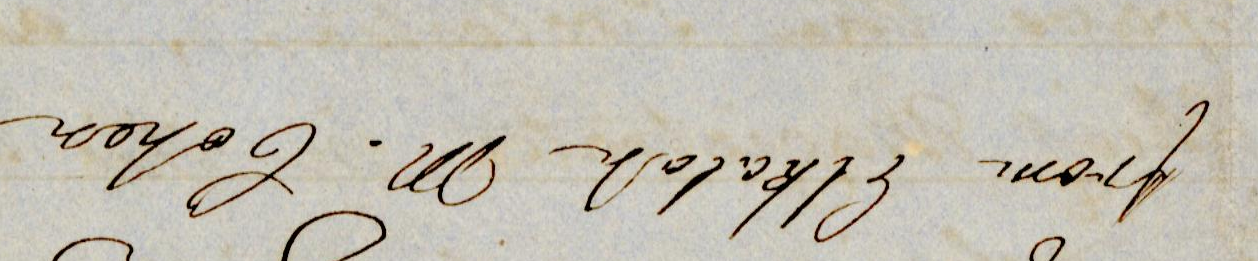from Elkalah M. Cohen
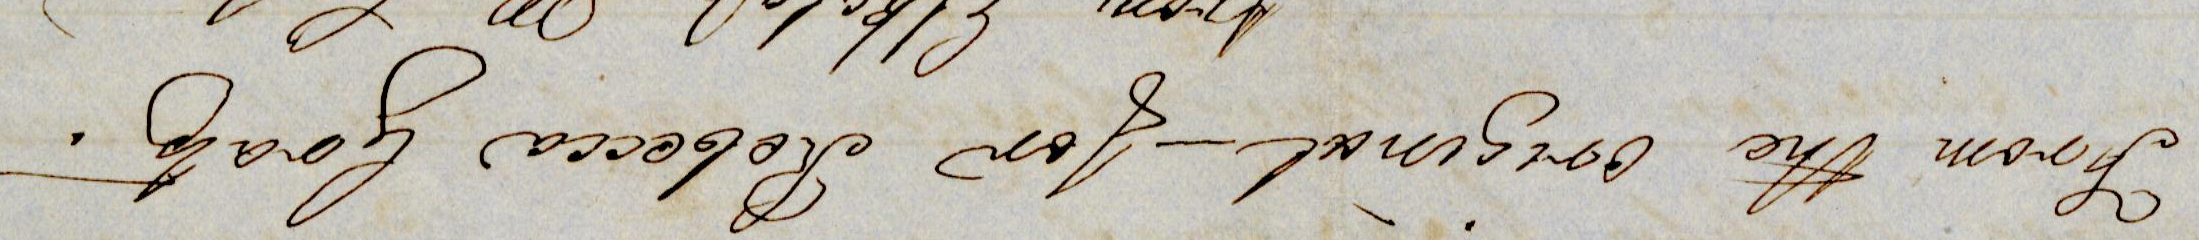From the original for Rebecca Gratz
